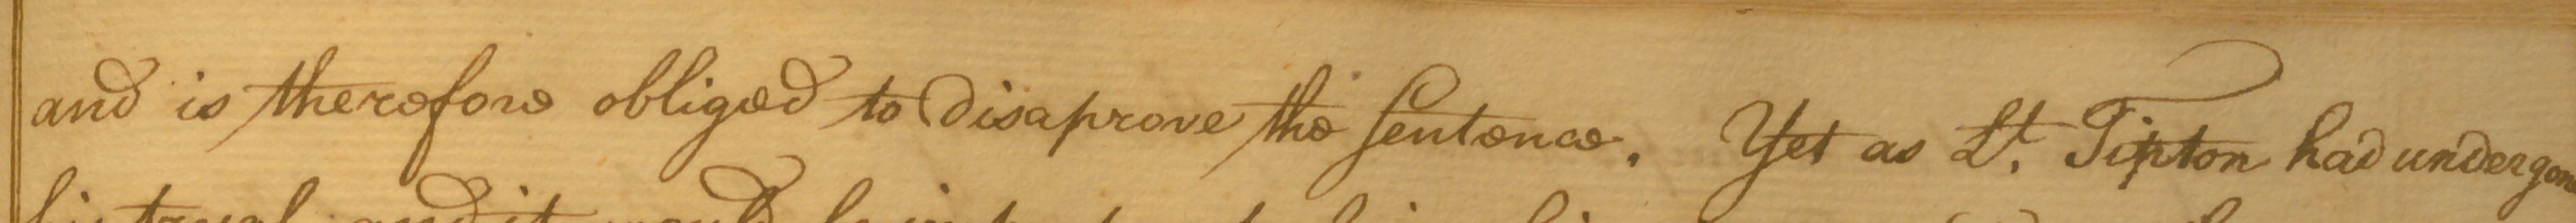and is therefore obliged to disaprove the sentence. Yet as L^t. Tipton had undergone
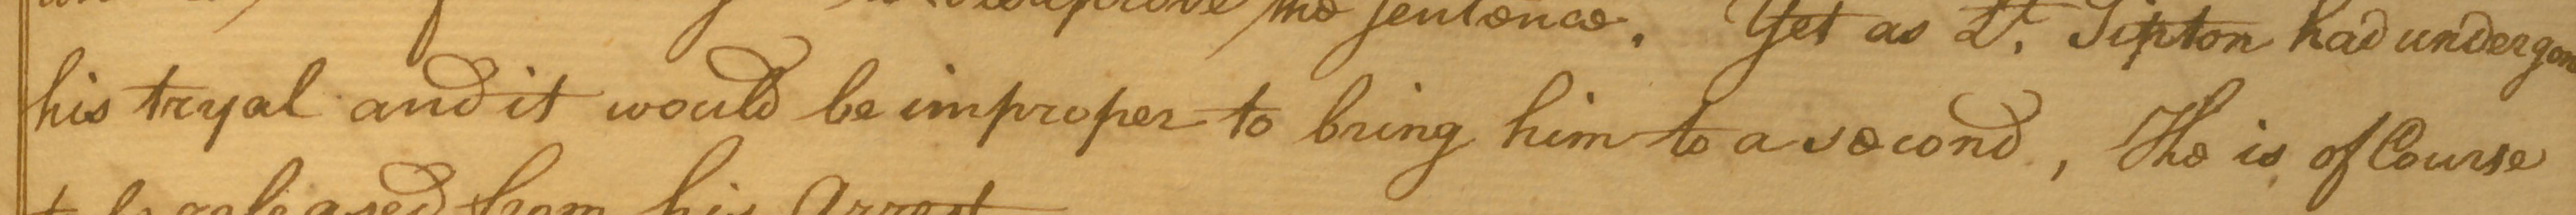his tryal and it would be improper to bring him to a second, He is of course
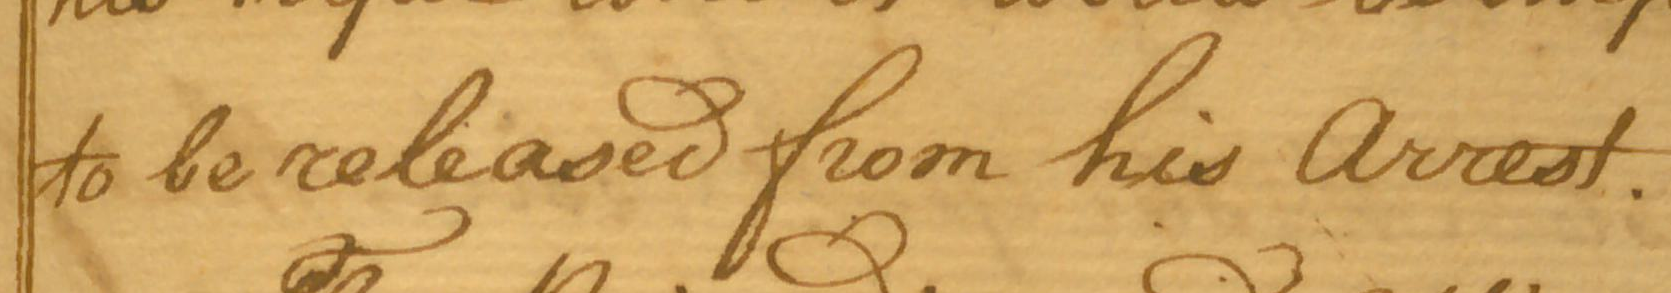to be released from his Arrest.
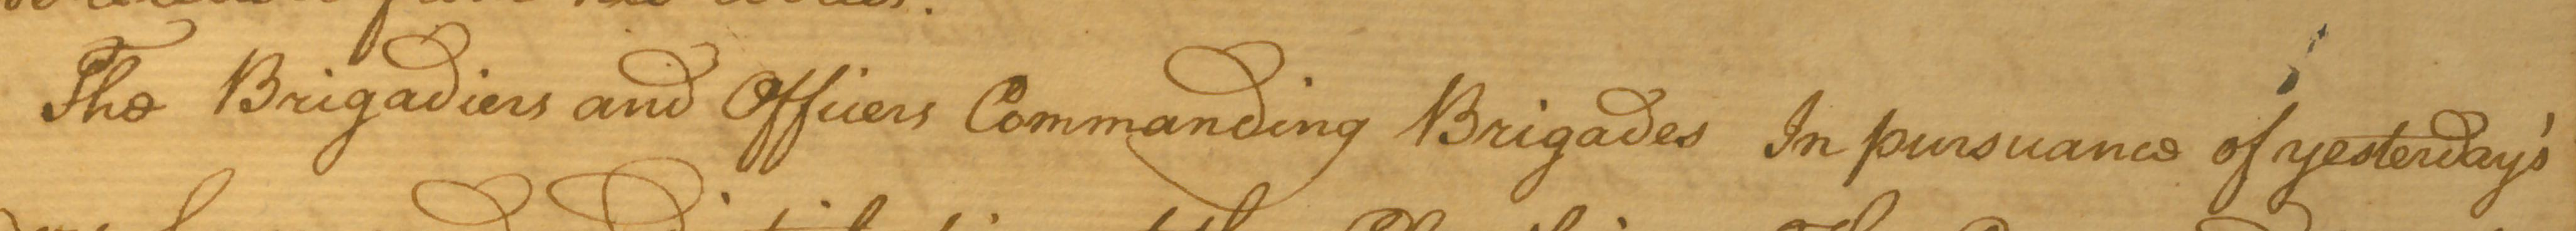The Brigadiers and Officers Commanding Brigades In pursuance of yesterday's
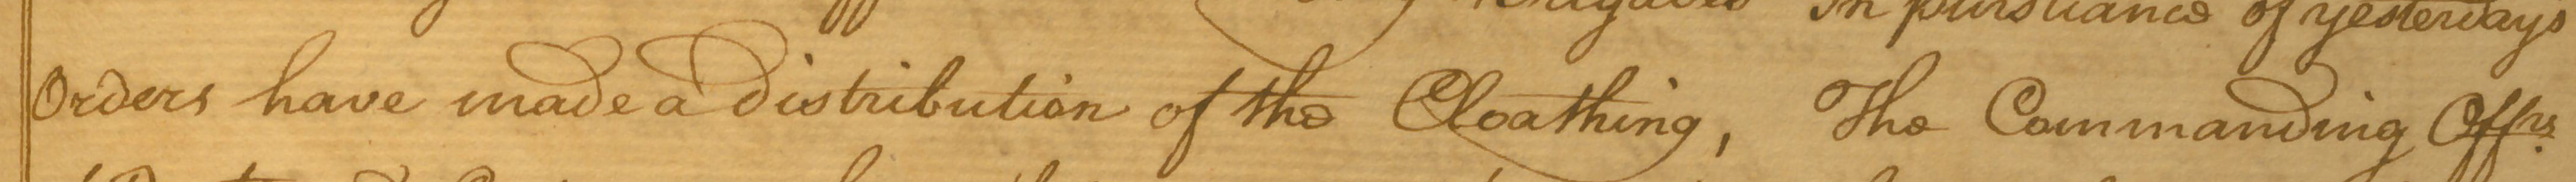orders have made a distribution of the Cloathing, The Commanding Off^rs.
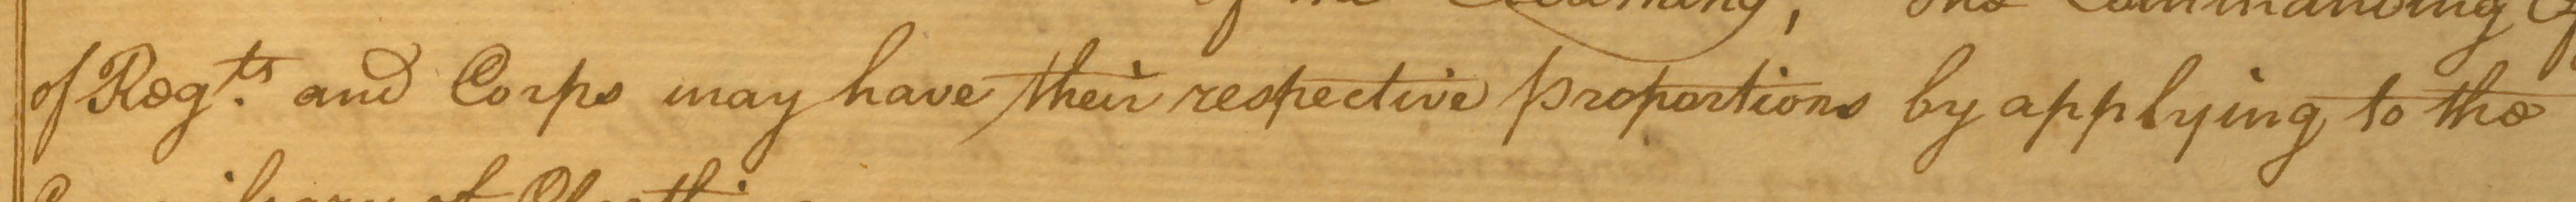of Reg^ts. and Corps may have their respective proportions by applying to the
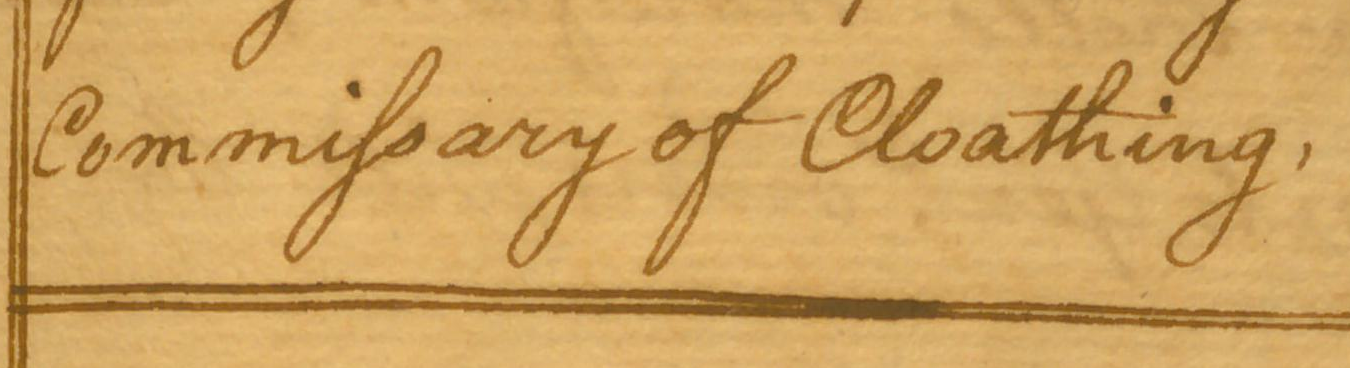Commissary of Cloathing.
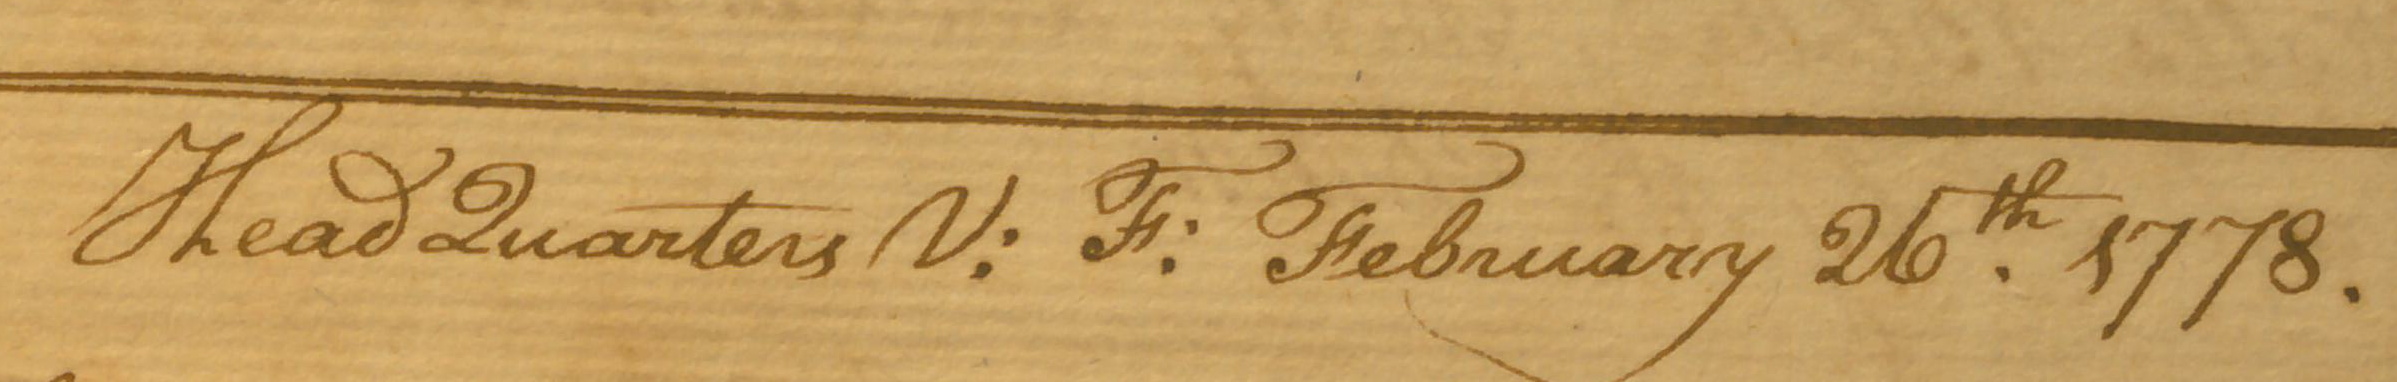Head Quarters V: F: February 26^th. 1778.
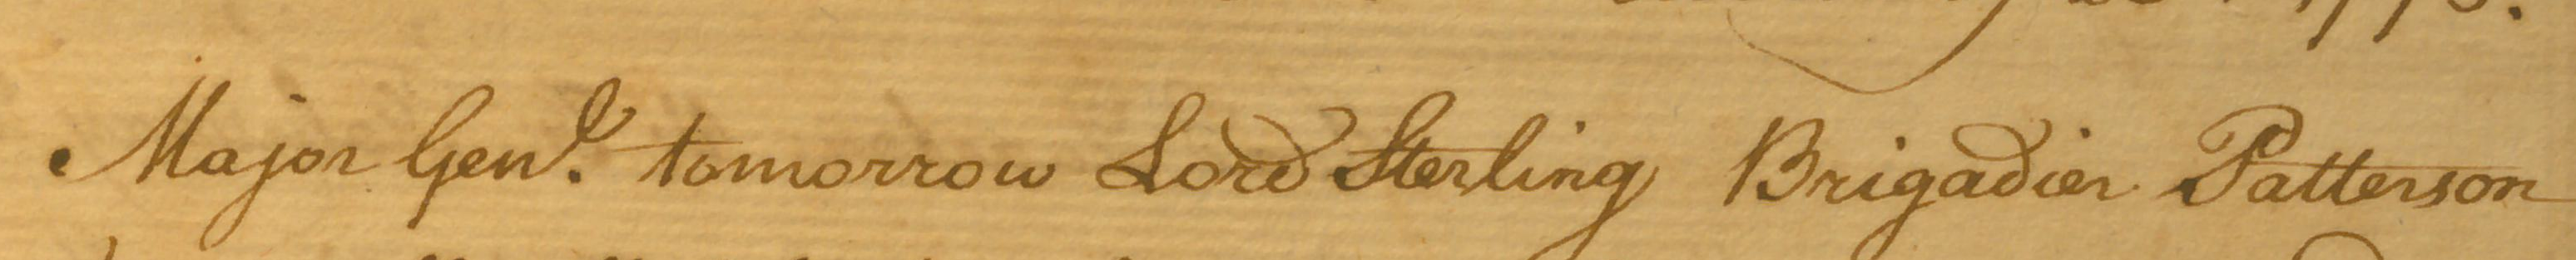Major Gen^l. tomorrow Lord Sterling Brigadier Patterson
